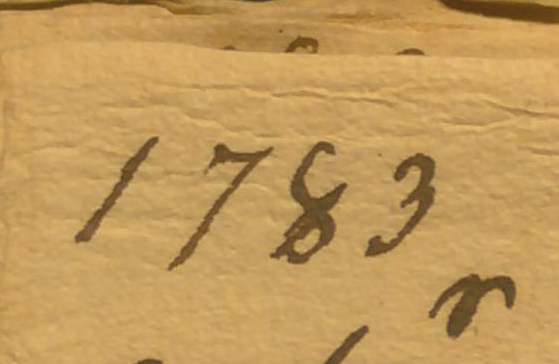1783
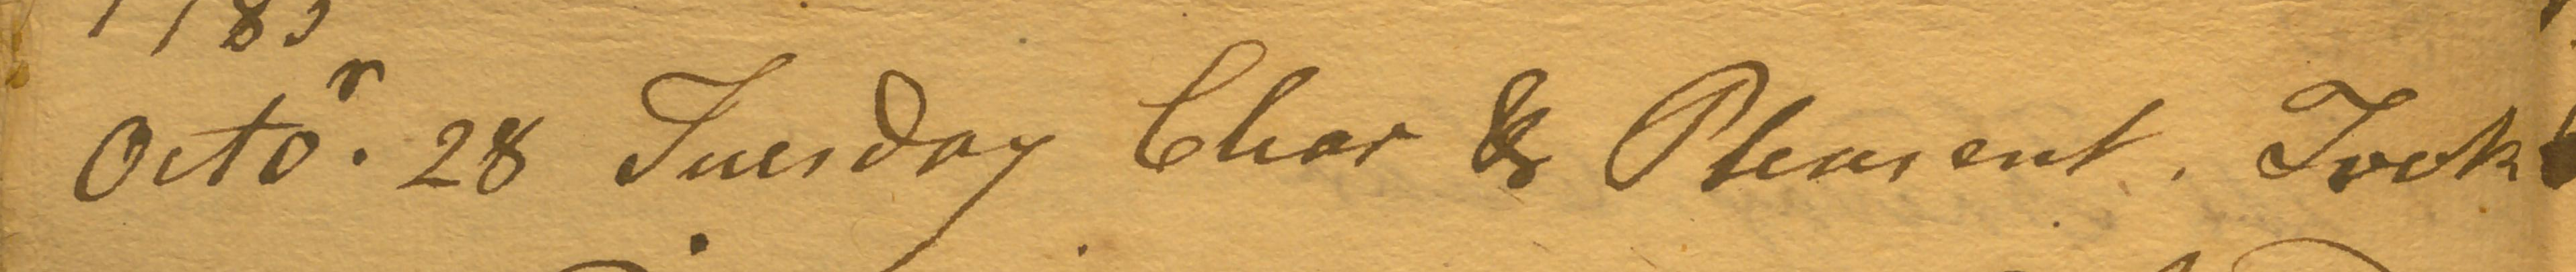Octo^r. 28 Tuesday Clear & Pleasent. Took
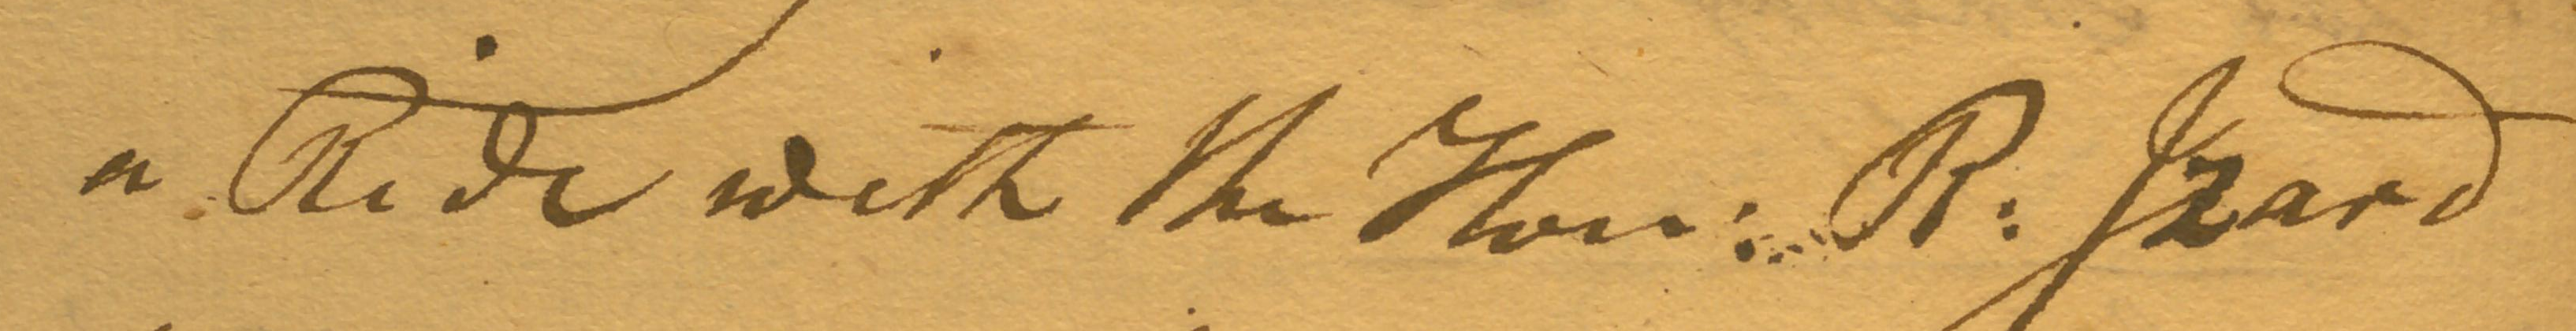a Ride with the Hon. R: Izard
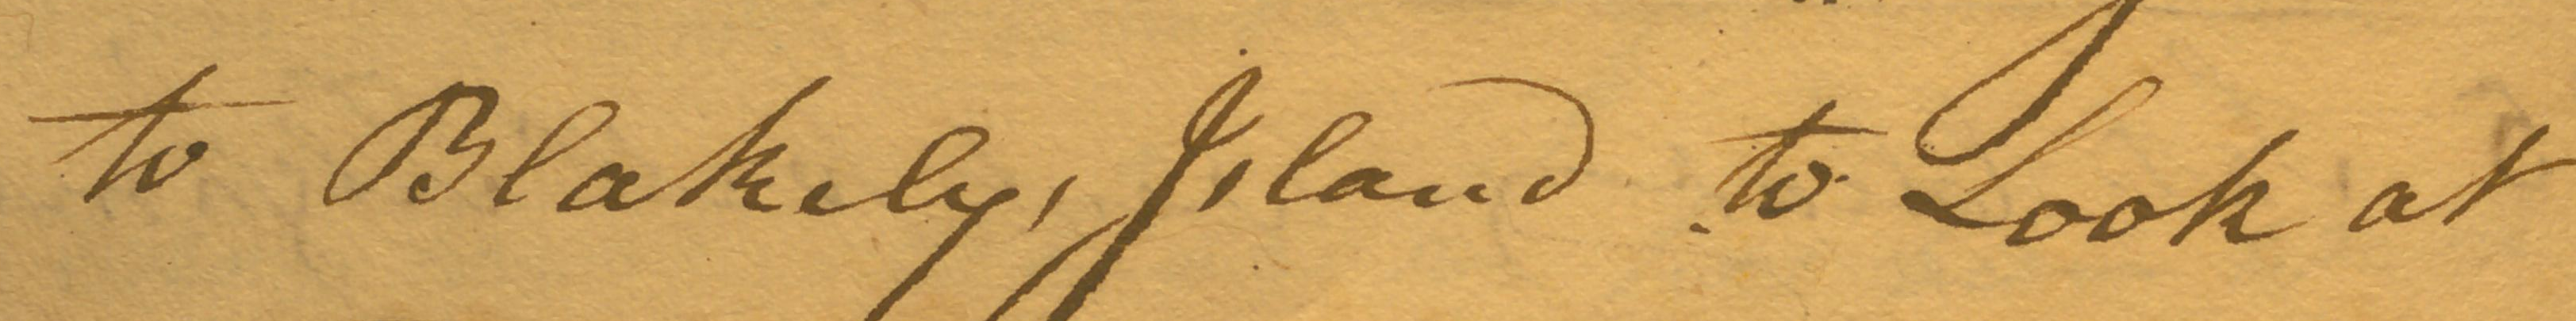to Blakely, Island to Look at
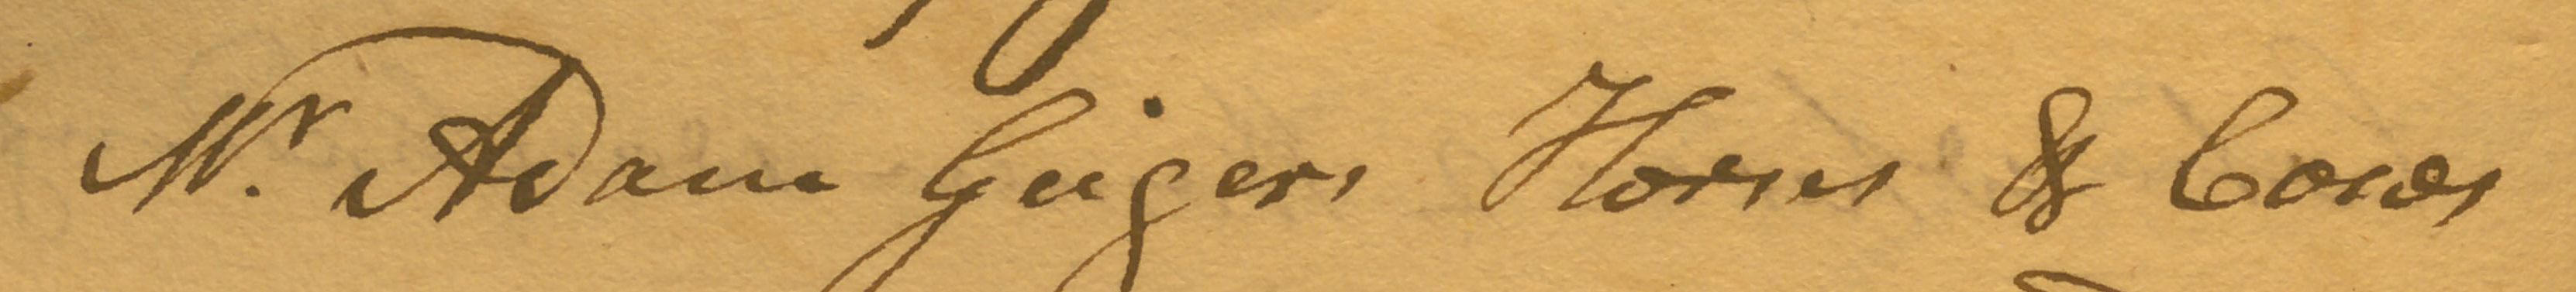M^r. Adam Geigers Horses & Cows
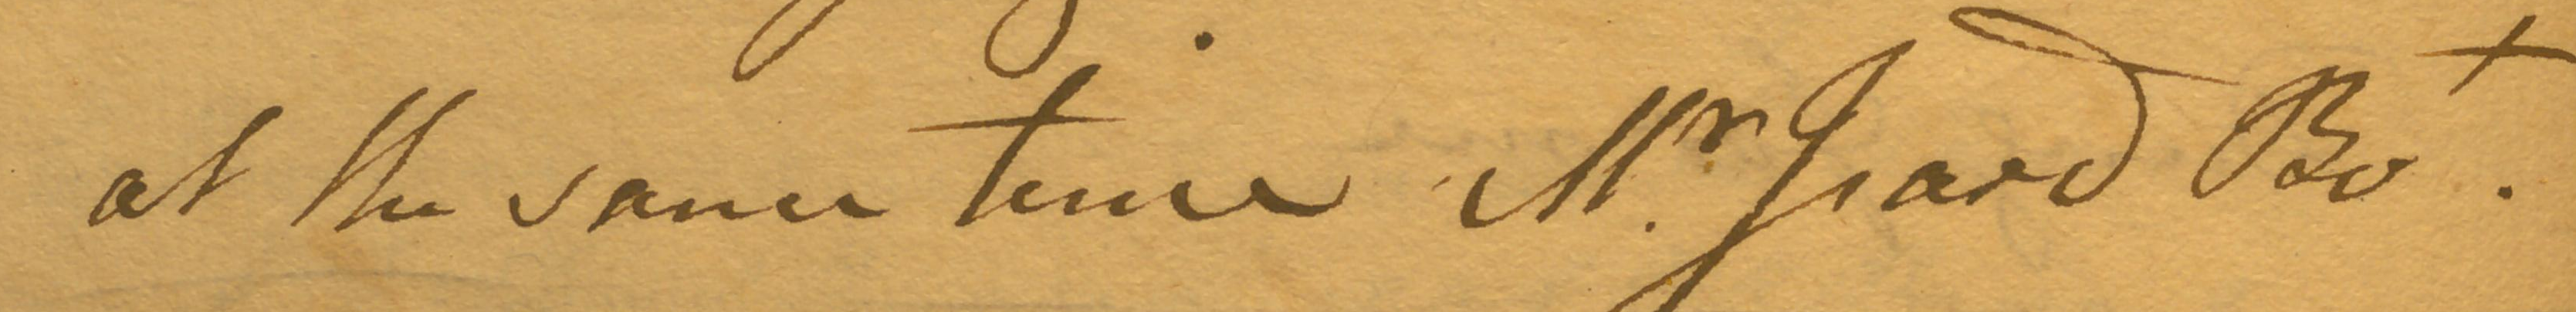at the sance time M^r. Izard Bo^t.
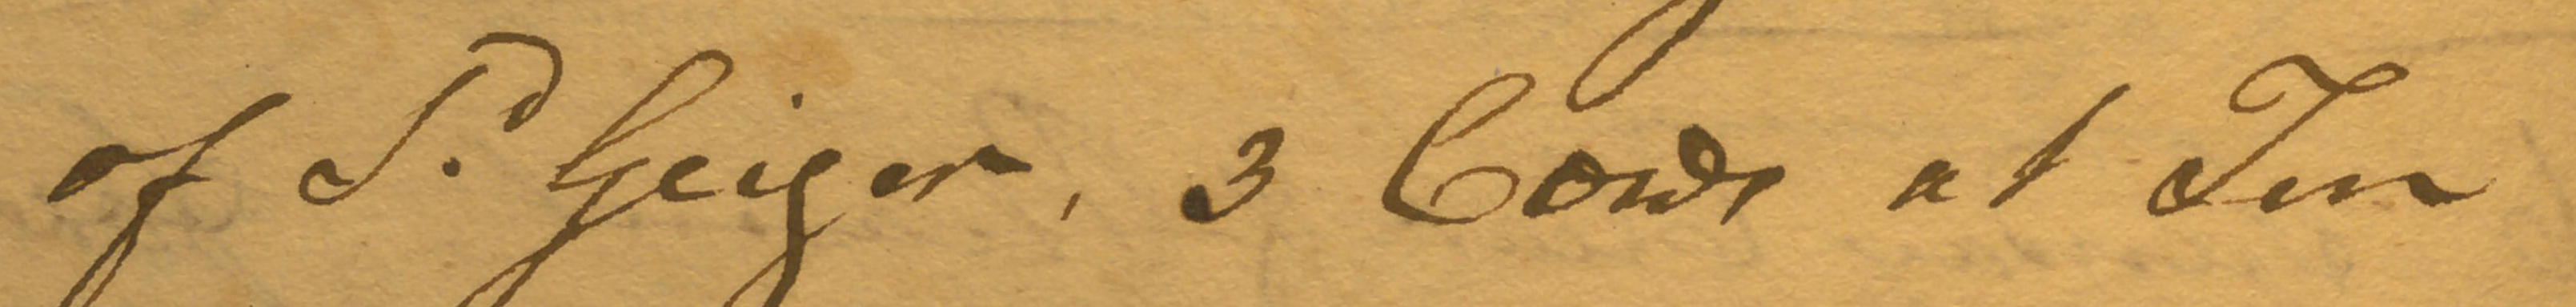of s^d. Geiger, 3 Cows at Ten
